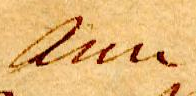Arm
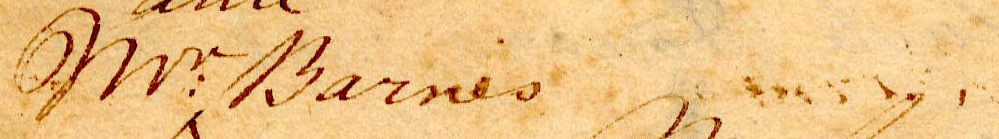M^r. ^ Barnes
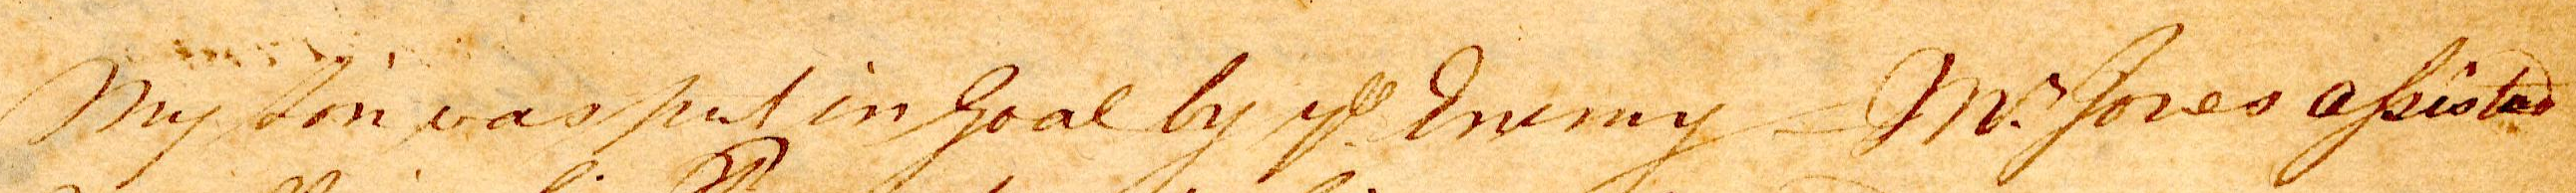My son was put in Goal by Y^e Enemy. M^r. Jones assisted
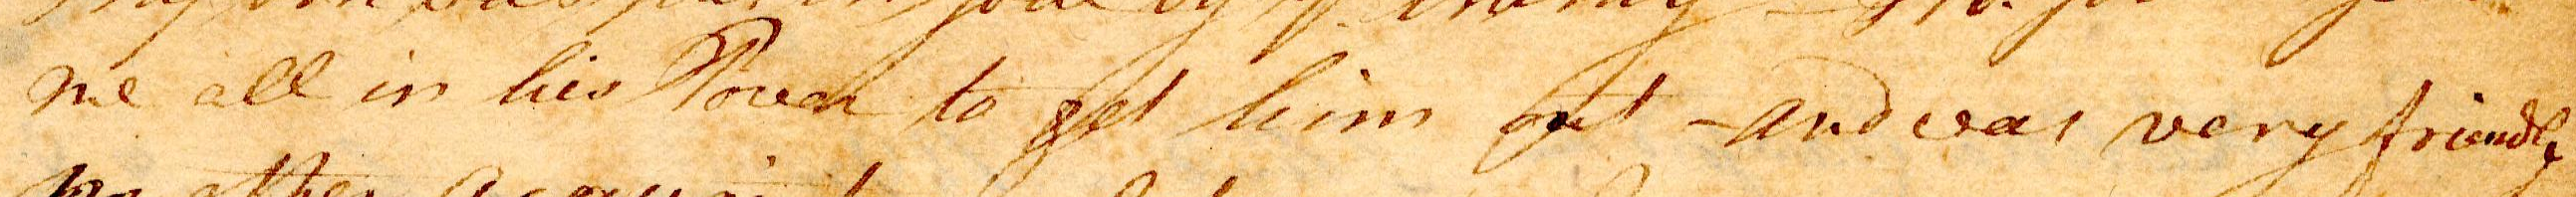me all in his Power to get him out -and was very friendly
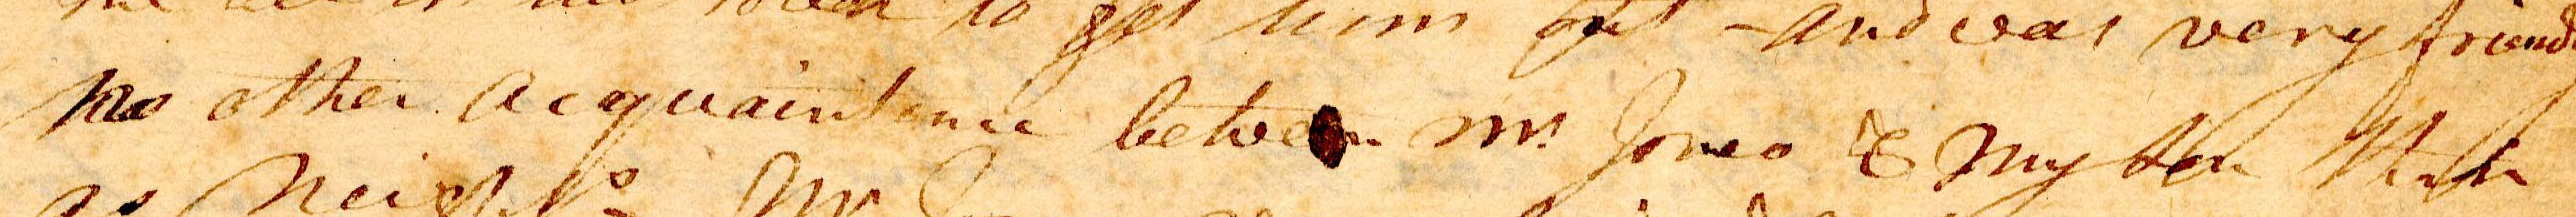no other acquaintance between M^r. Jones & my son [__]
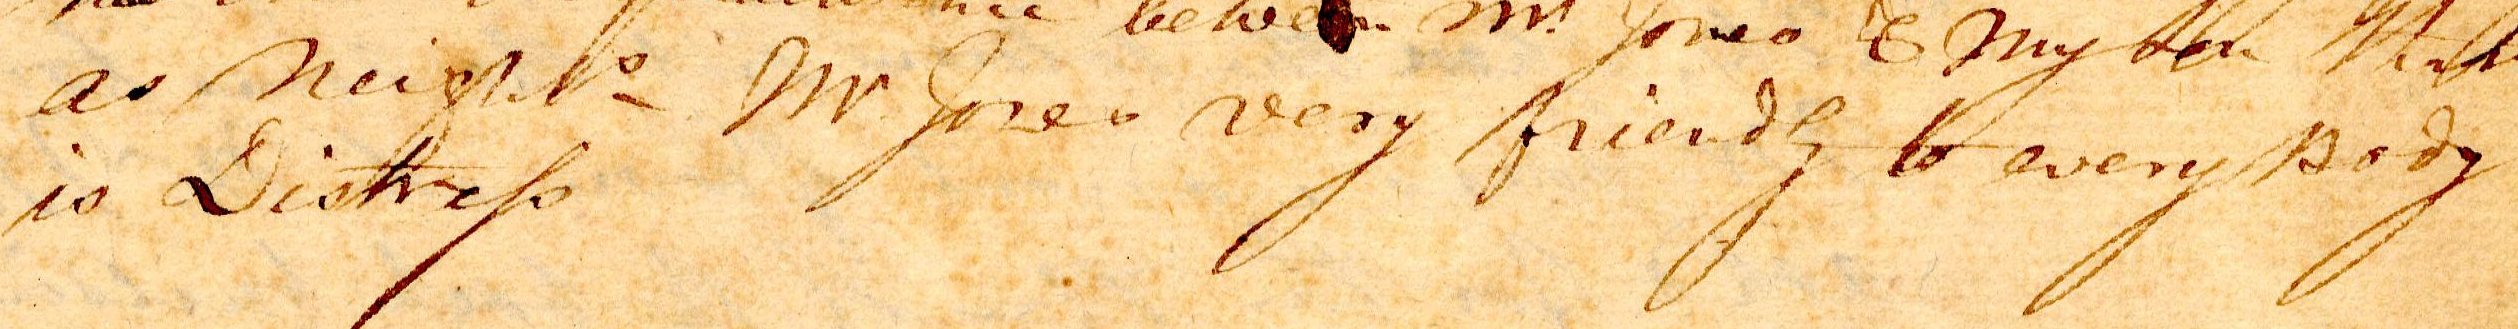as neighbors- M^r Jones very friendly to every body
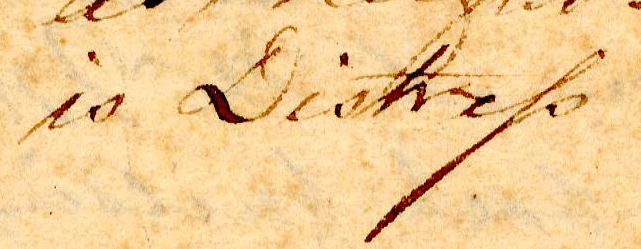in Distress
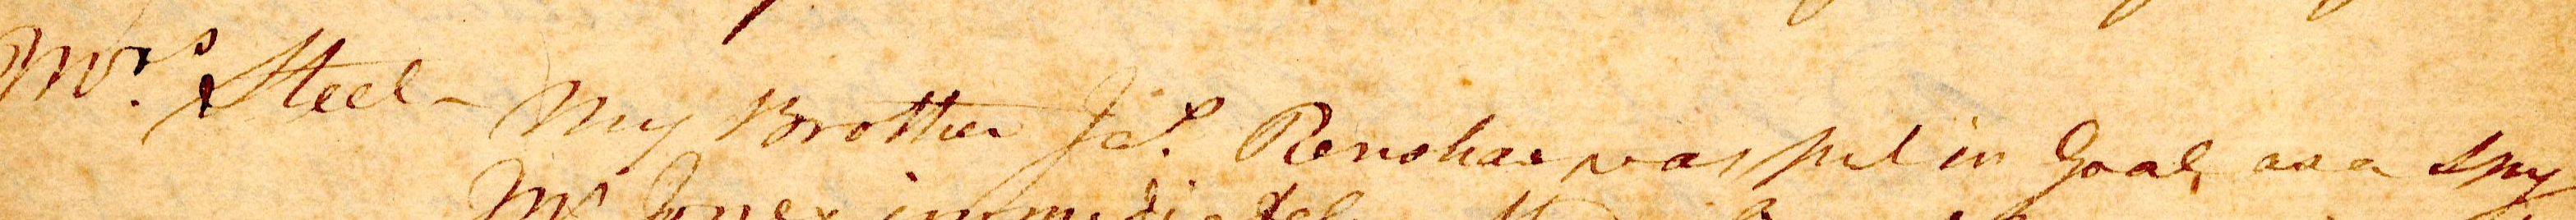M^rs. Steel - My Brother Ja^s Renohas was put in Goal, as a spy
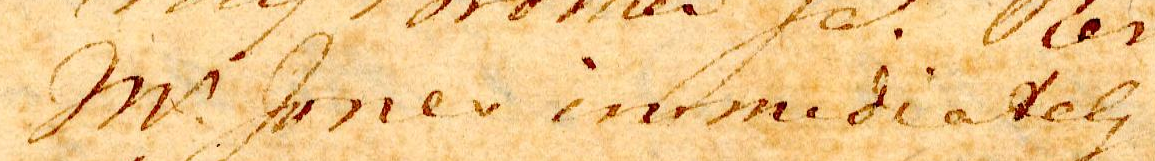M^r Jones immediately
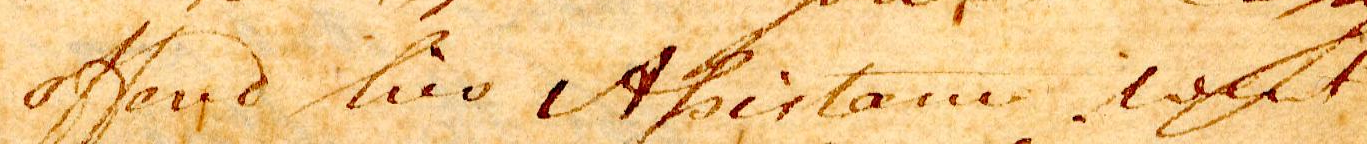offered his Assistance, went
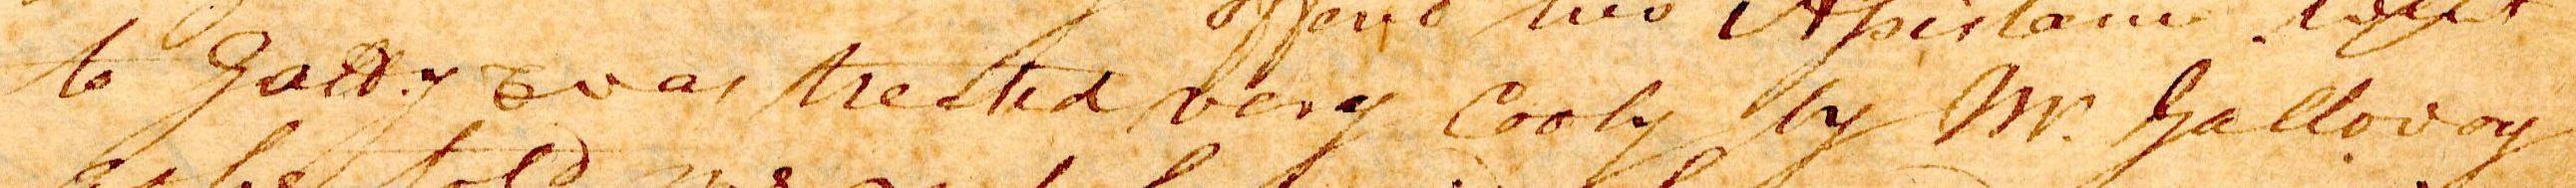to Gaol & was treated very cooly by M^r. Galloway
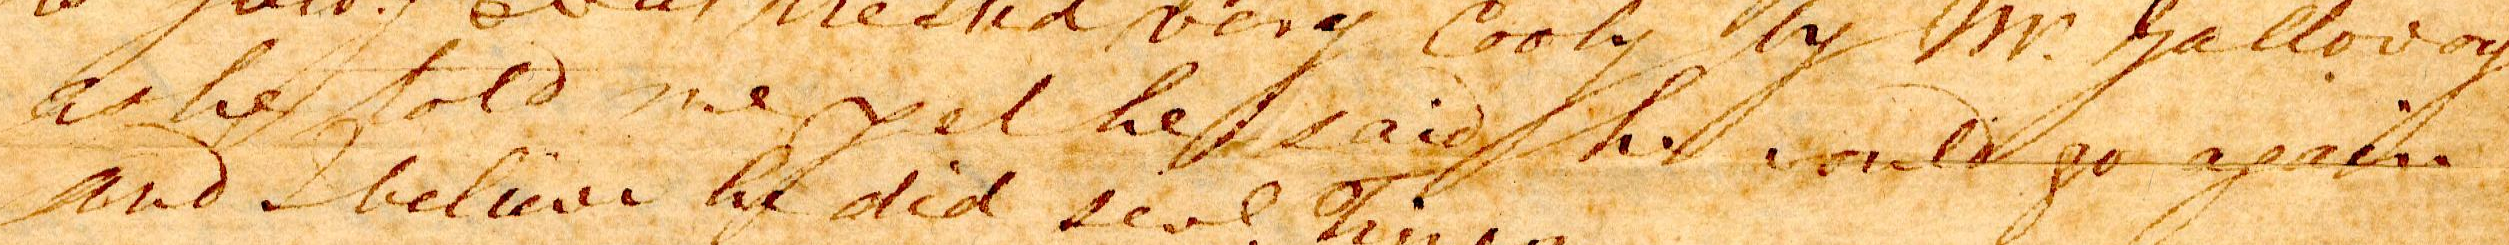as he told me yet he said he would go again
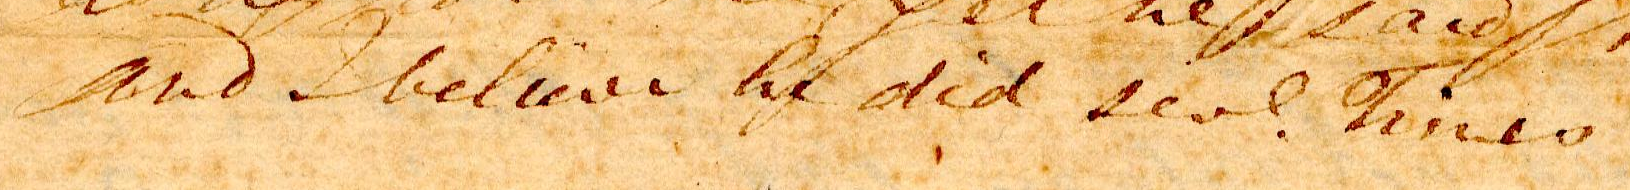and believe he did sev^l. times
